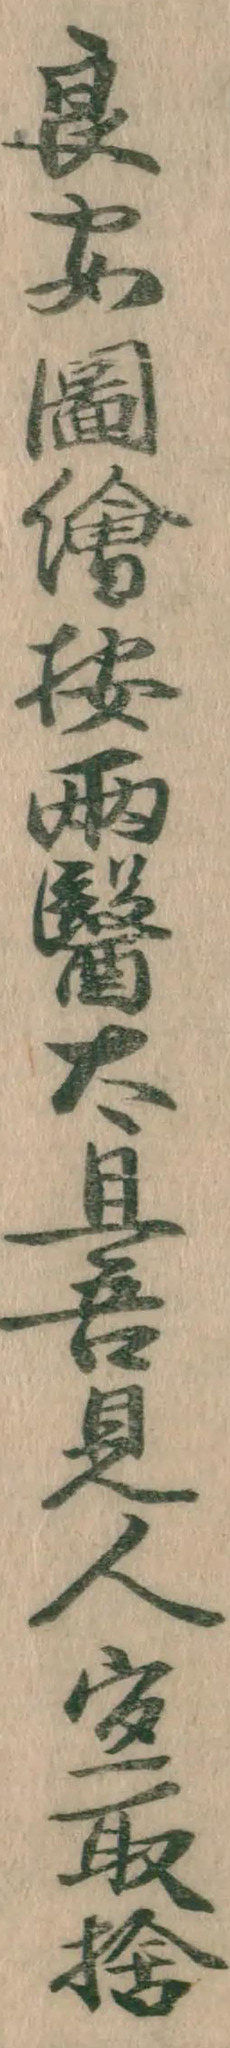良安図絵按両医太且吾見人宜取捨
